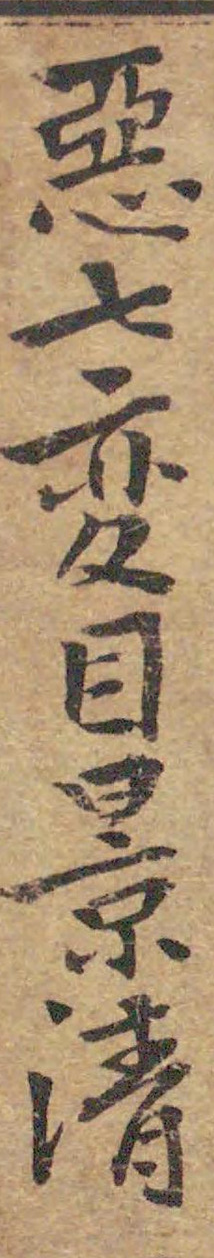悪七変目景清

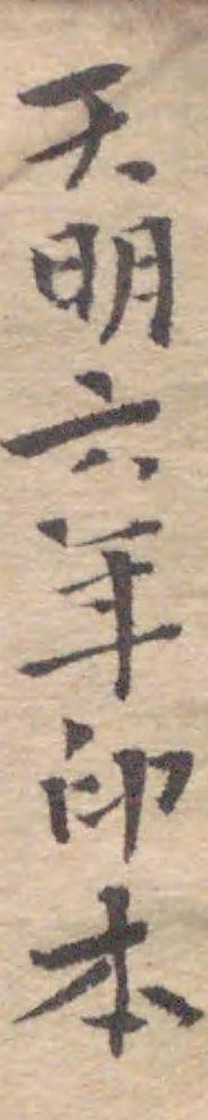天明六年印本

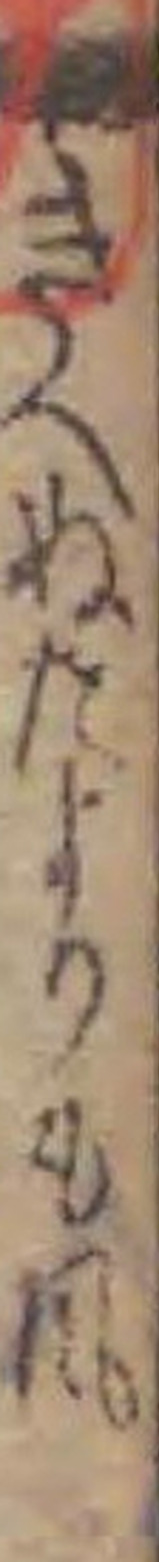きへぬたよりも風
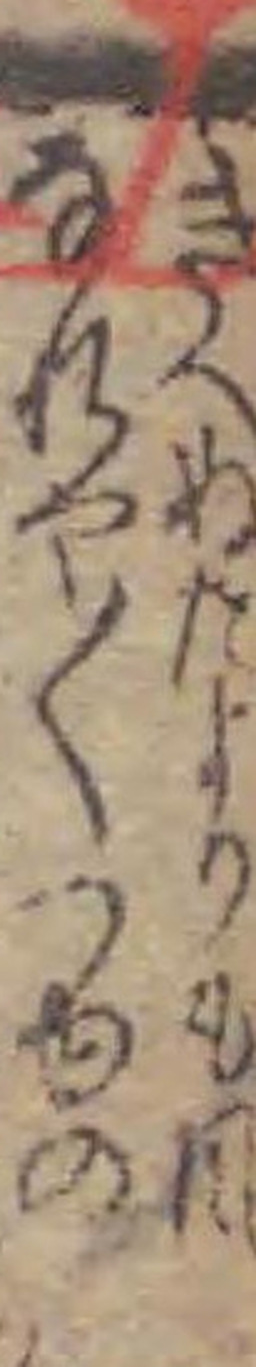なれや〳〵つゆの
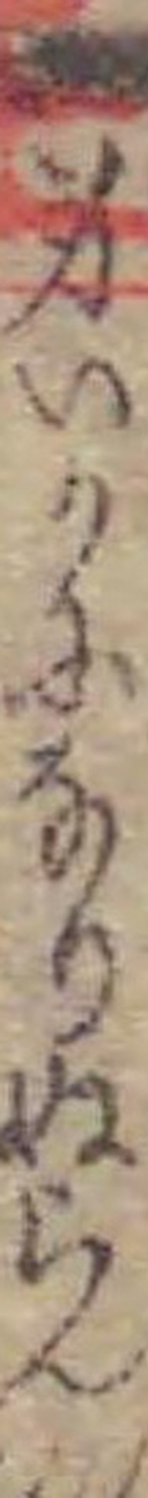身いかになりぬらん
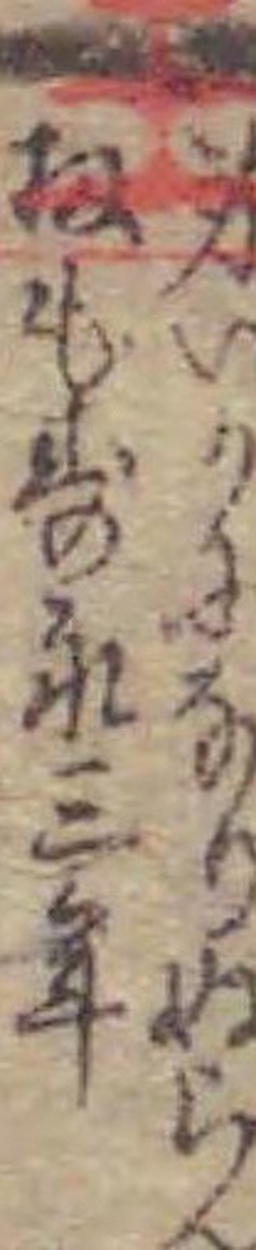扨も寿永三年
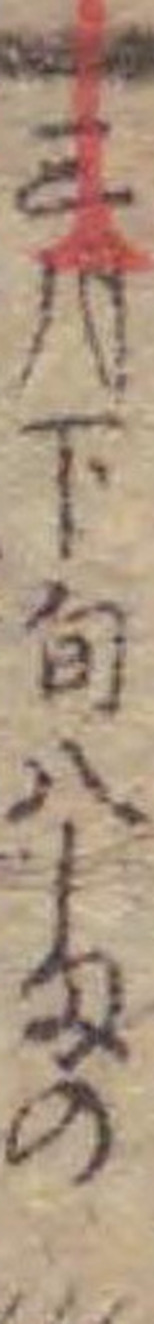三月下旬八しまの
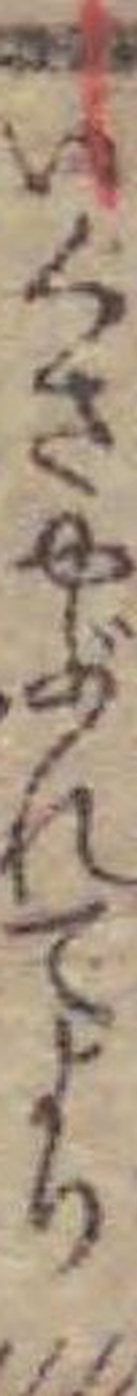いくさやぶれてより
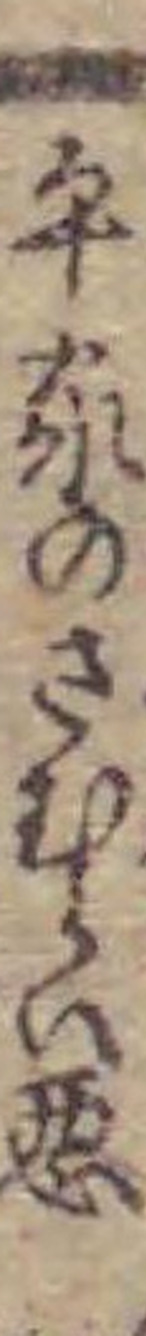平家のさむらい悪
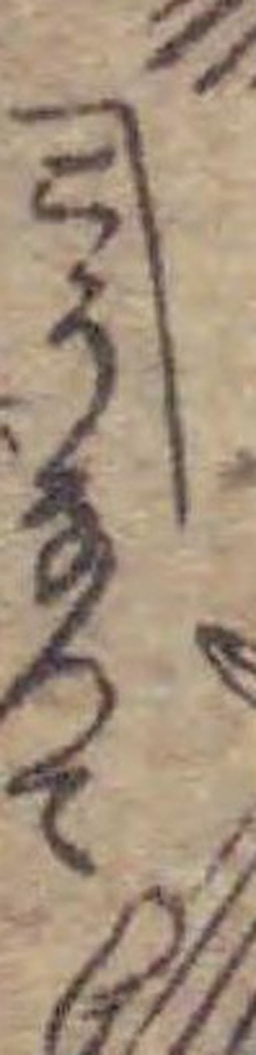〽こうなつて
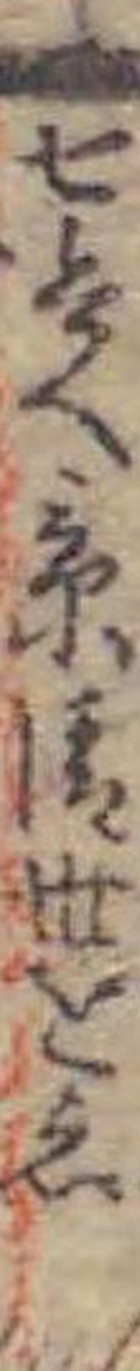七兵へ景清世をし
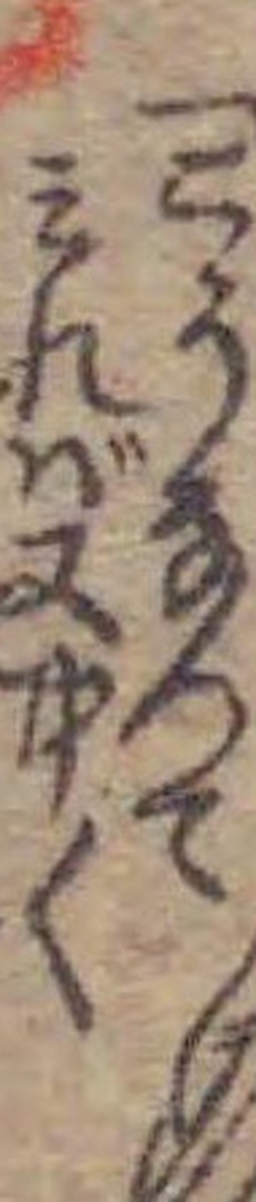みれば又中〳〵
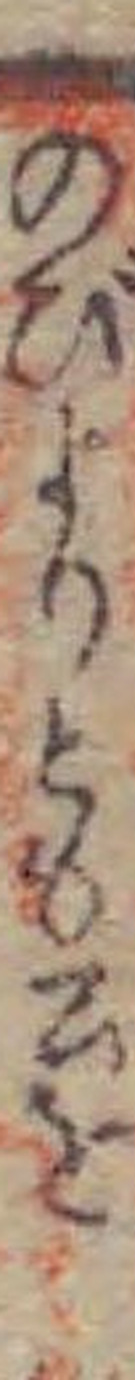のびよりとも公を
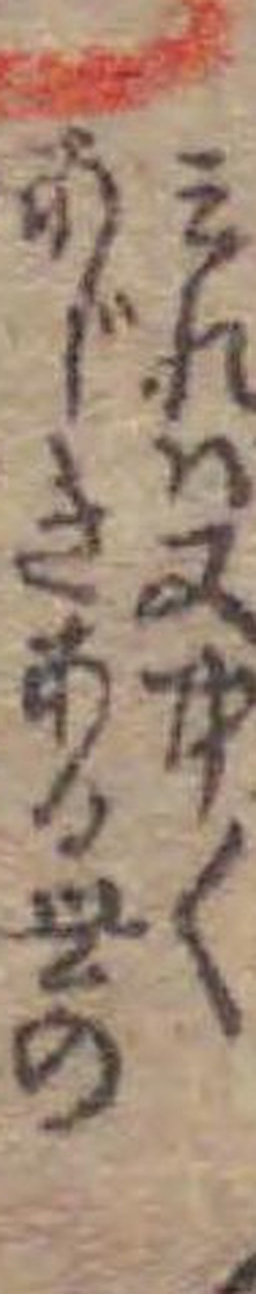あじきある世の
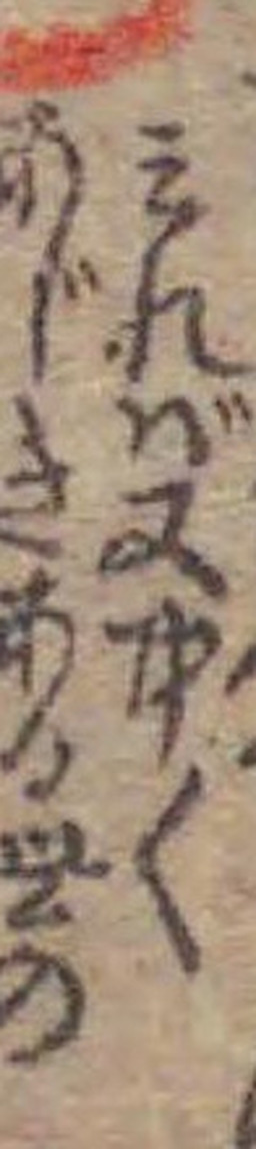あじきある世の
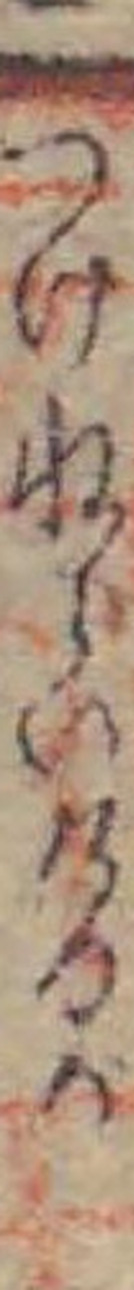つけねらいけるが
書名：悪七変目景清 : 2巻
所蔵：国立国会図書館 National Diet Library, JAPAN
